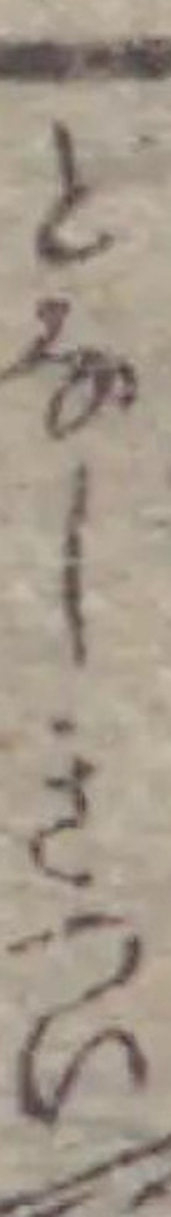となしきつい
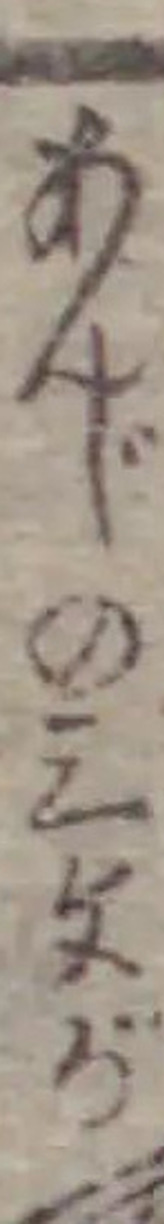あんじの三文が
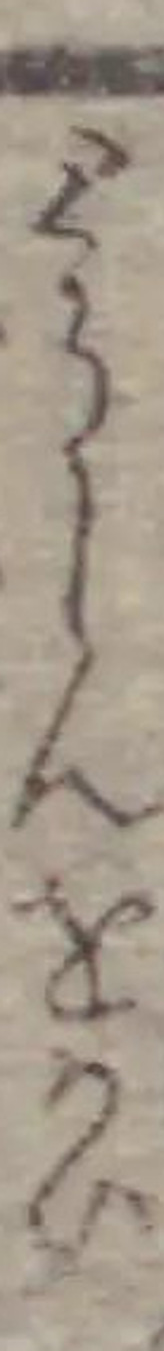とうしんをかい
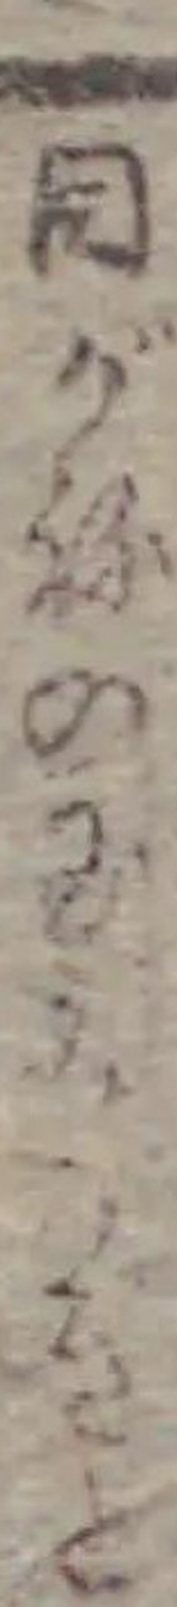目がねの玉みがきと
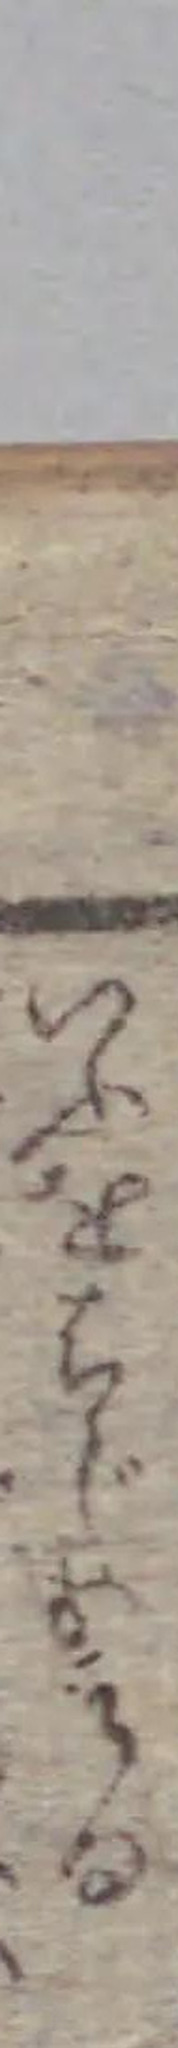いふをはじめける
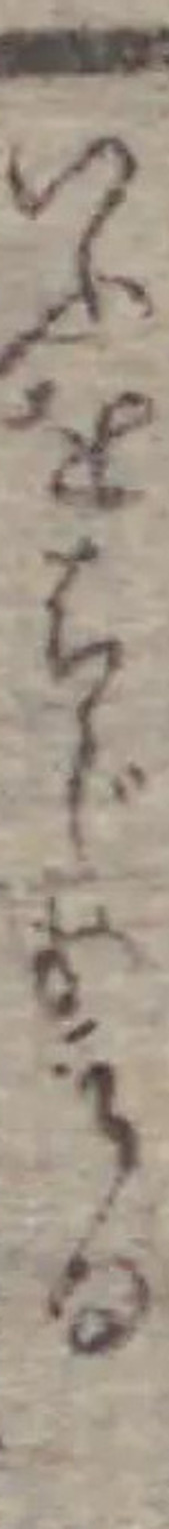いふをはじめける
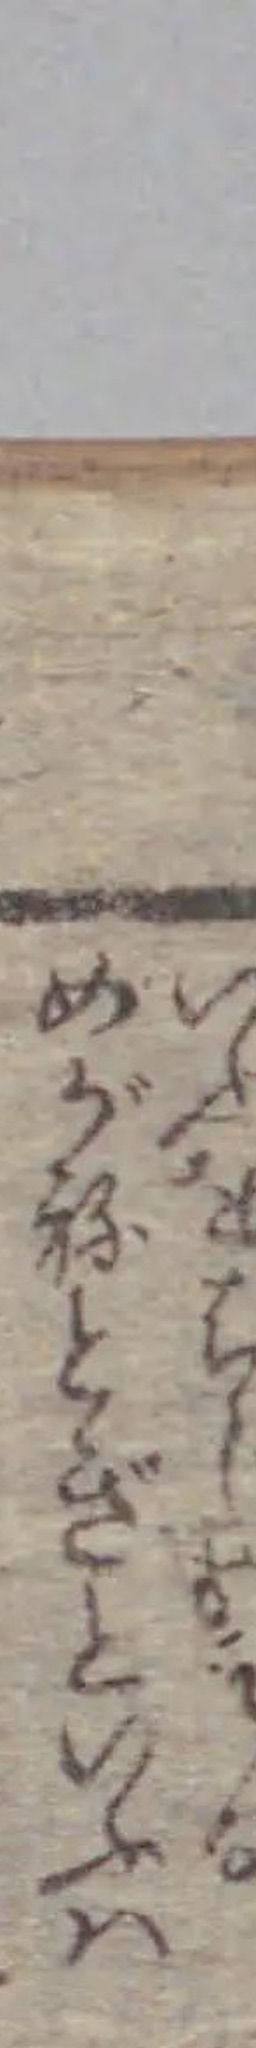めがねとぎといふは
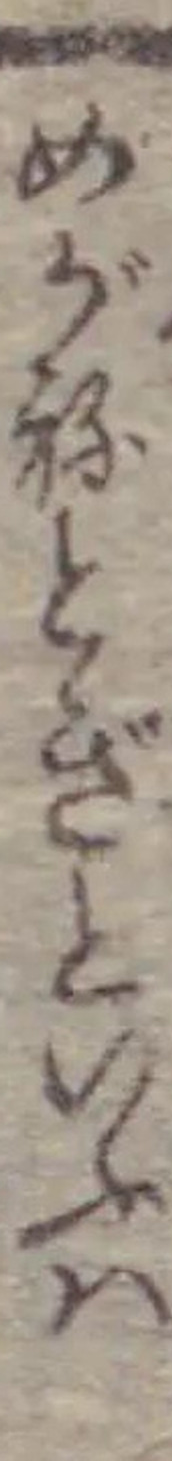めがねとぎといふは
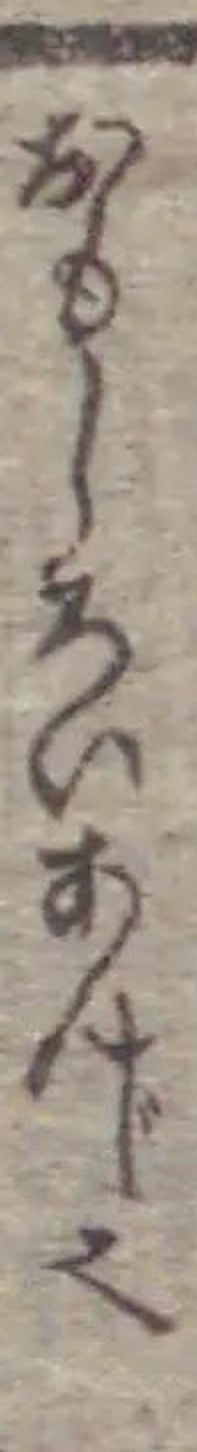おもしろいあんじ也
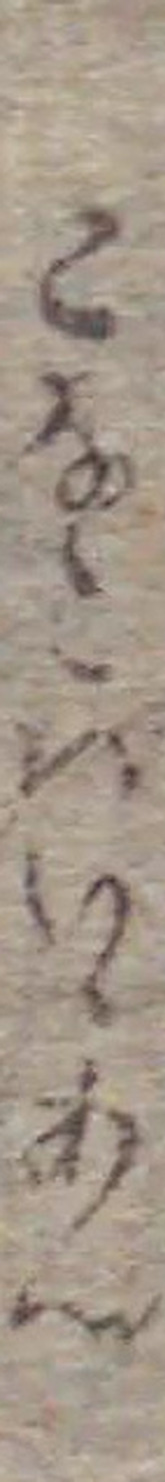こなこはいゝあん
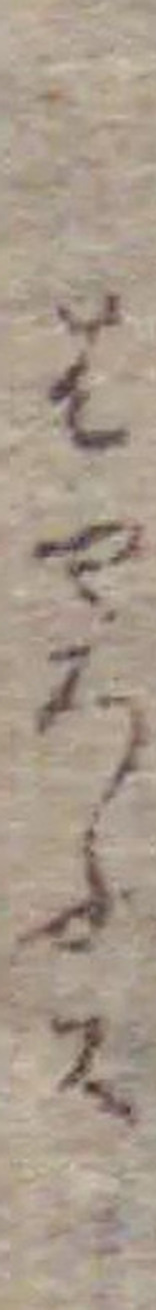はやろふス

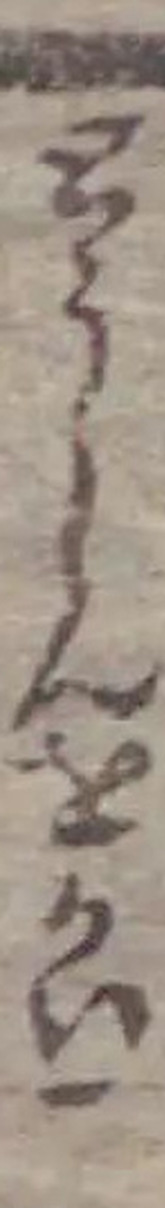とうしんをかい
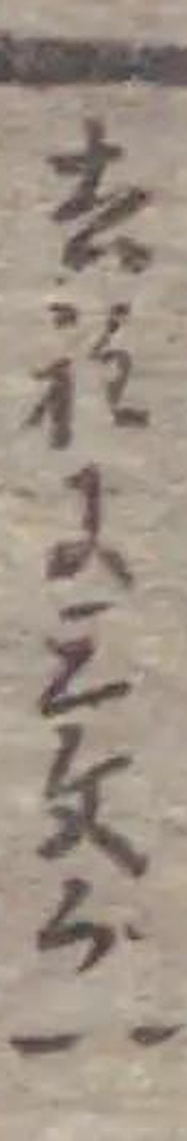去程に三文が
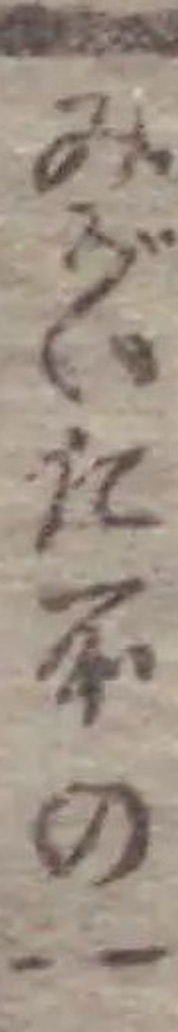みがいた所の
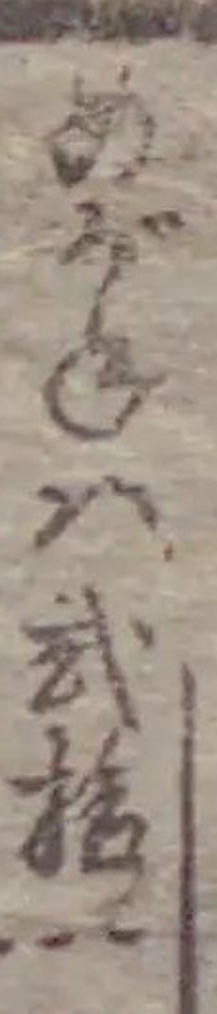めがねは弐拾
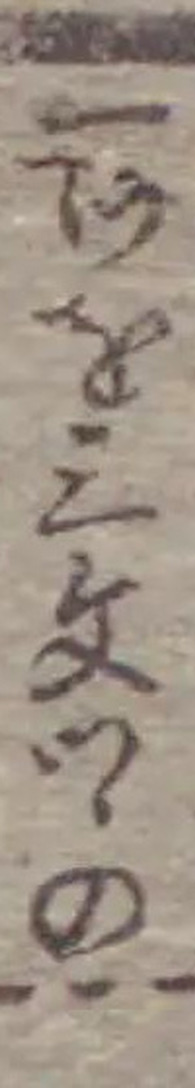一ッを三文ツヽの
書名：栄増眼鏡徳 3巻
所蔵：国立国会図書館 National Diet Library, JAPAN
